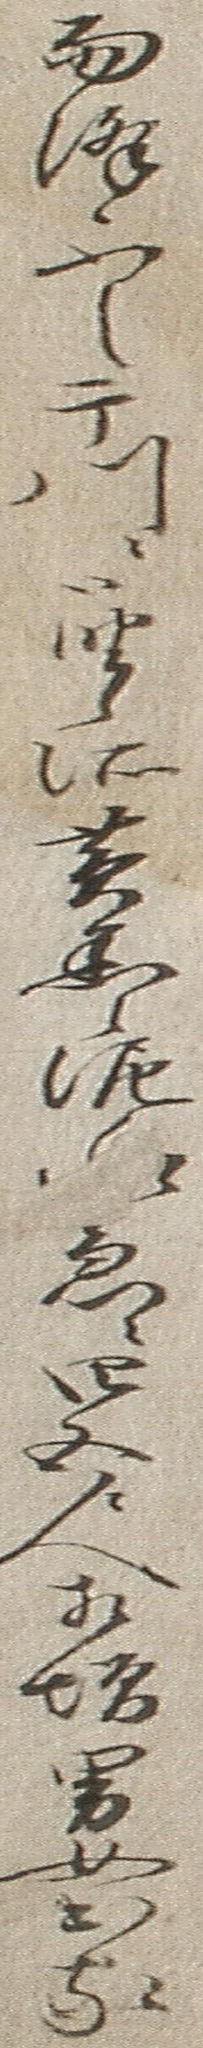雨降不申干川に御座候候所黄黒之泥水急に四五尺相増男女出家
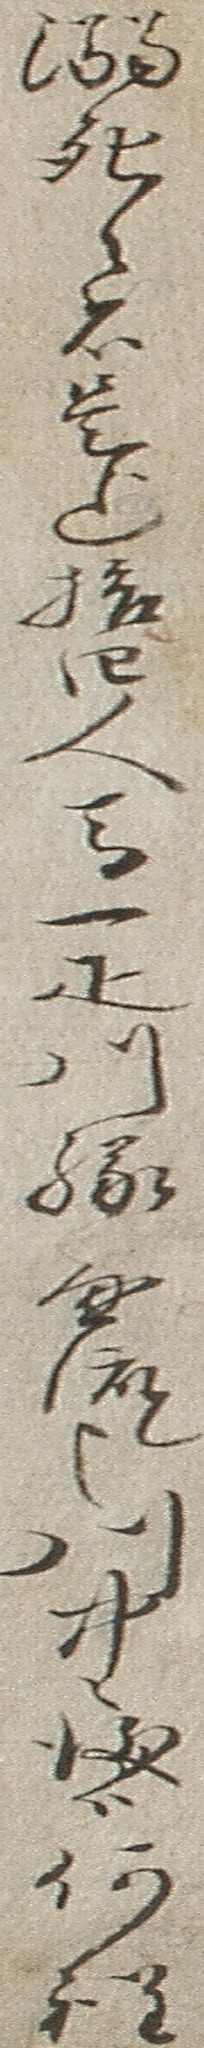溺死之者是迄拾四人馬一疋川縁通流れ申候川中之儀は何程
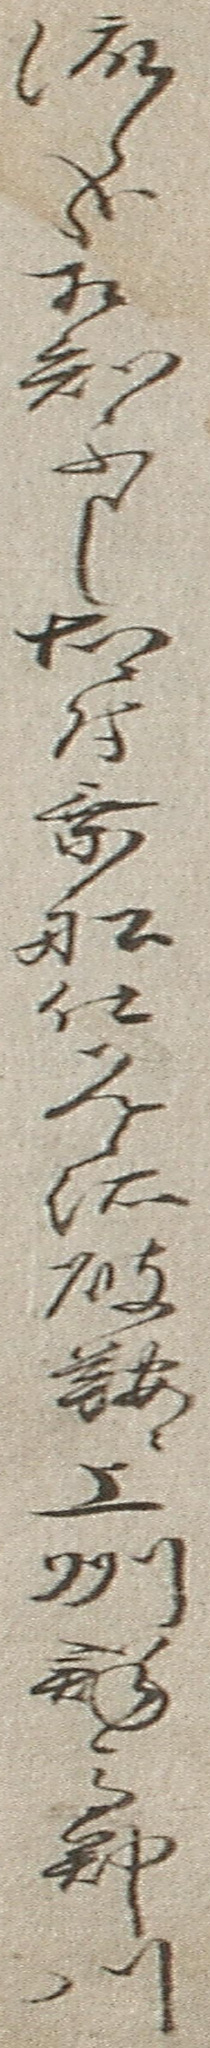流候哉相知不申候右に付乗船仕見候所破鞍に上州群馬郡川
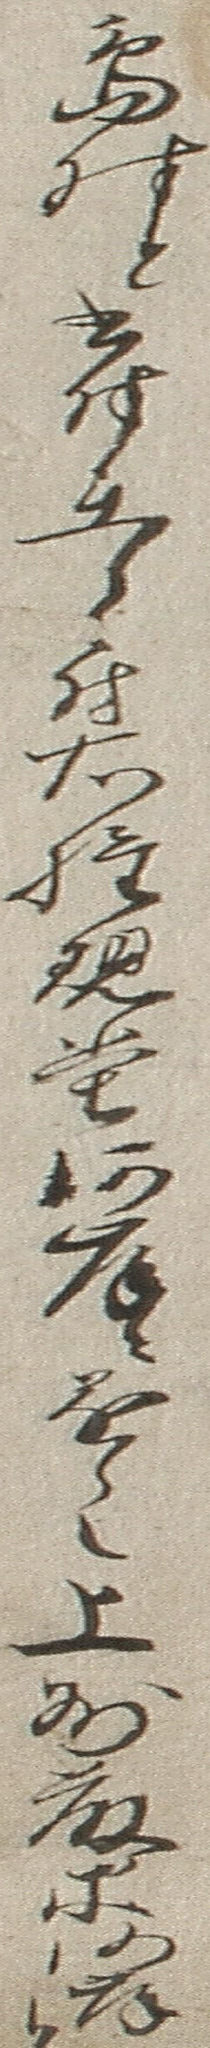島村と書付在之候に付右権現堂河岸に懸り候上州藤ノ木河岸と

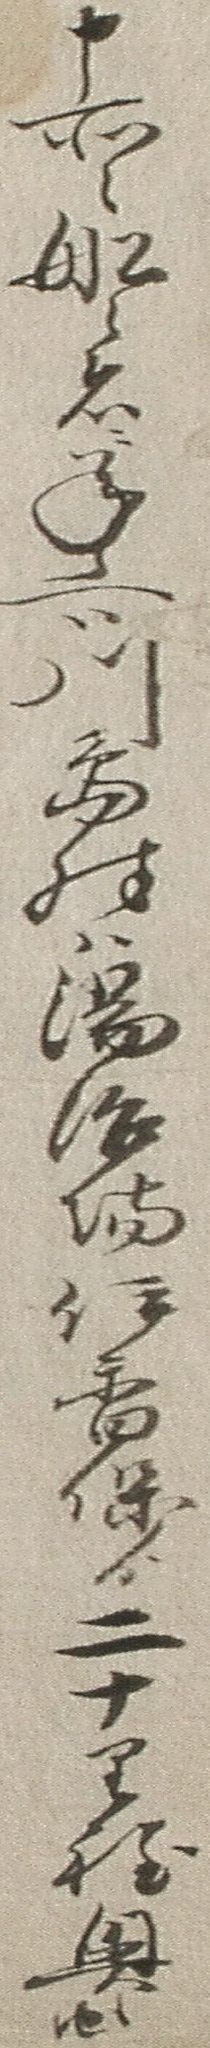申所之船之者に承候へは川島村は湯治場伊香保ゟ二十里程奥之由
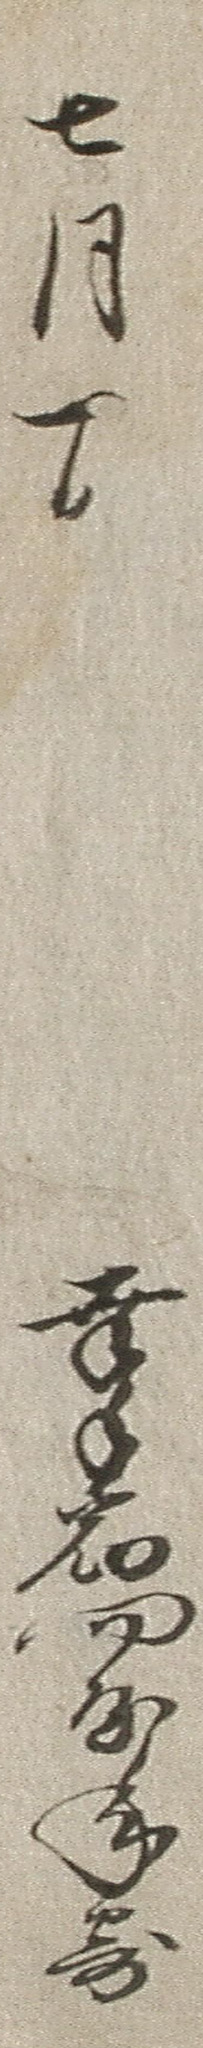卯七月十日幸手宿問屋年寄
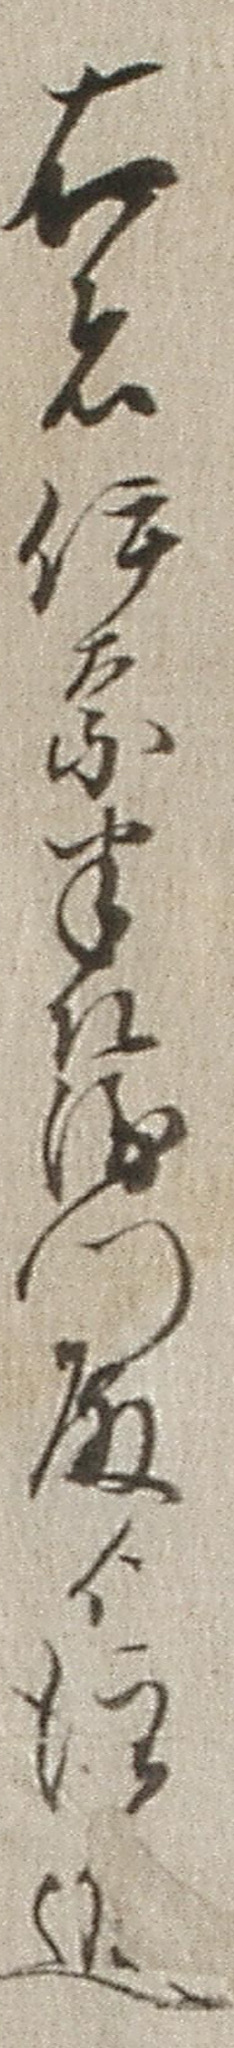右者伊奈半左衛門殿ゟ注進
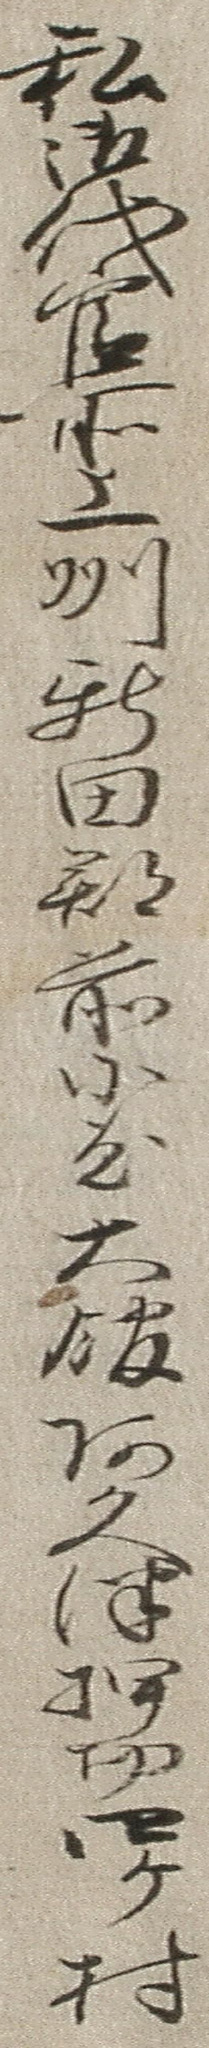私御代官所上州新田郡前小屋大館阿久津押切四ヶ村
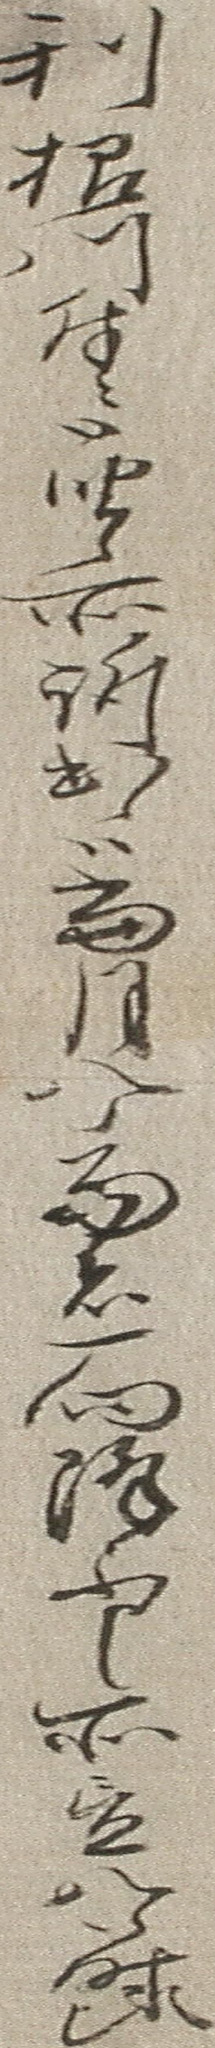利根川付に御座候所訴出候は当月八日雨者一向降不申候所昼八ッ時頃
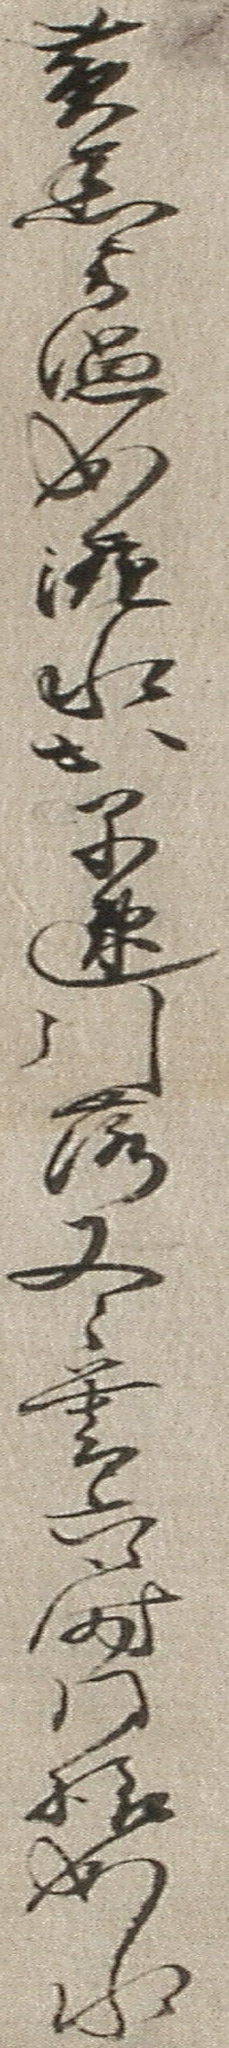黄黒ニ而温？成泥？水出早速引落又々暮六ッ時同様成水
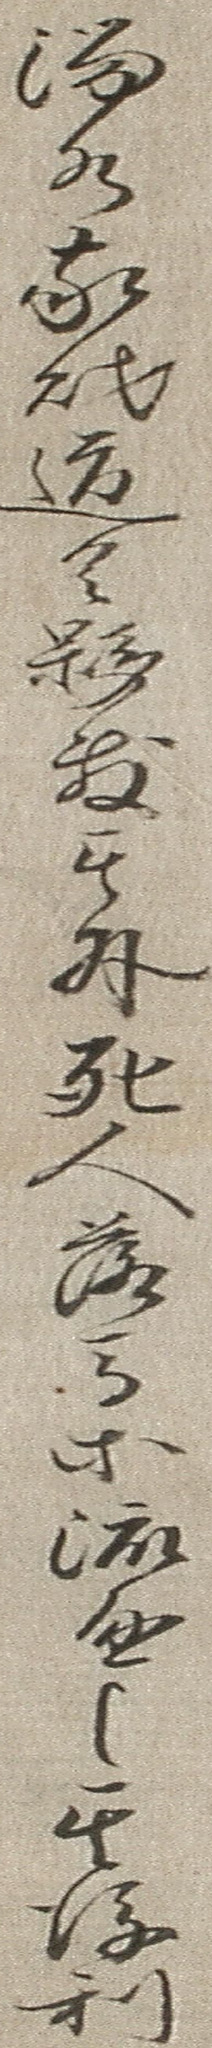溜水家財道具夥敷其外死人落馬等流通申候其後利
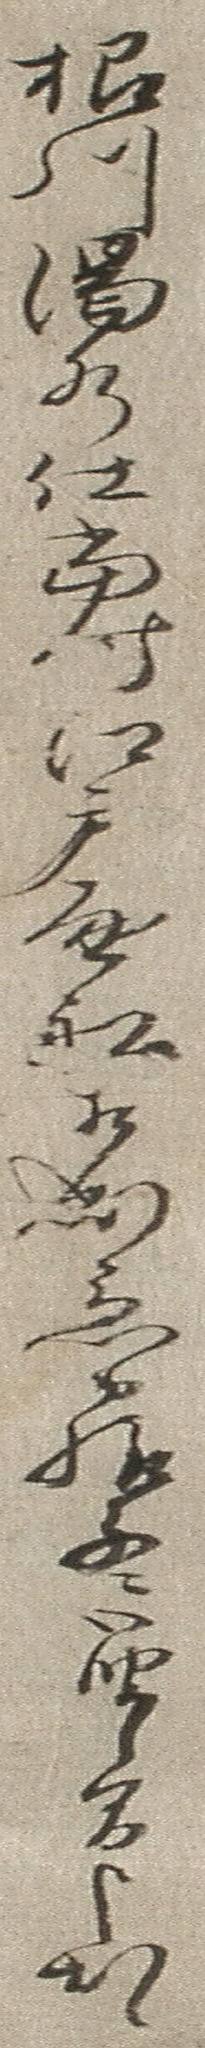根川渇水仕当時江戸通船相成兼候様子に御座候間申出候
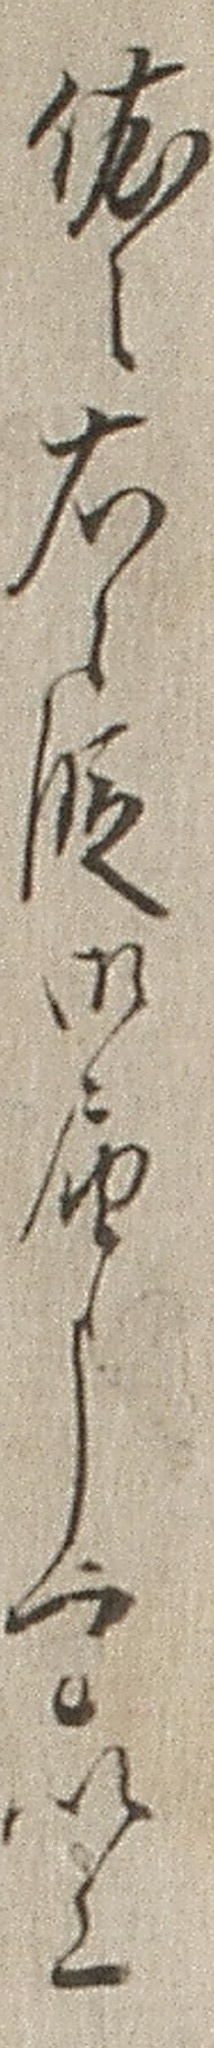依之右之段御届申上候以上
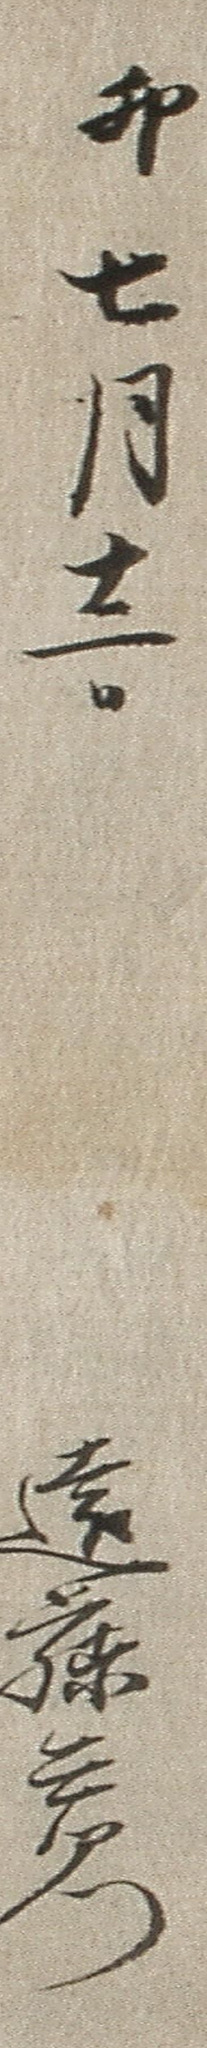卯七月十二日遠藤兵右衛門
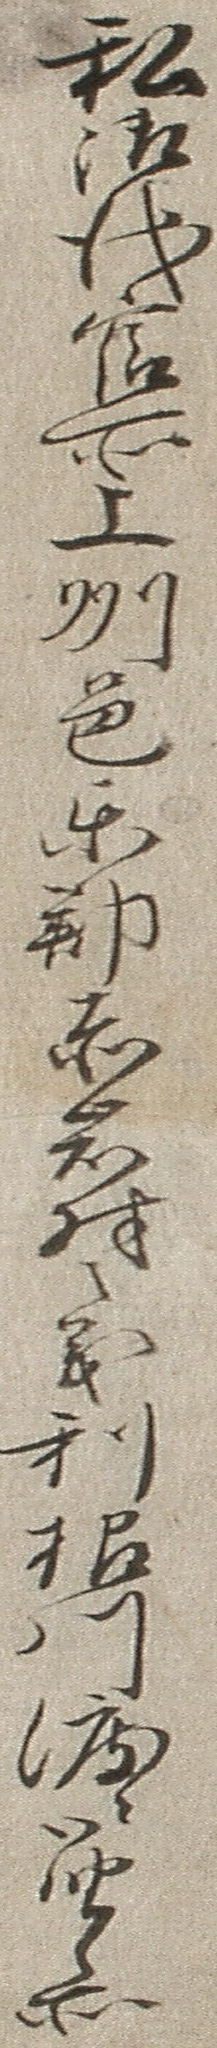私御代官所上州邑楽郡赤岩村之義利根川渡に御座候所
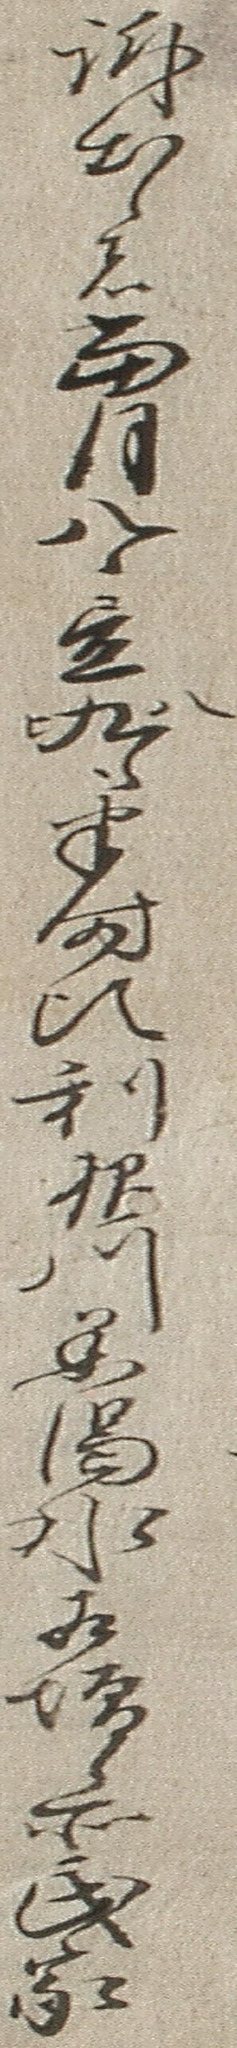訴出候者当月八日昼九ッ半時頃利根川黒褐水相増候所民家
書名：太平秘録抜書　浅間山燒及普賢山崩
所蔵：東京大学地震研究所図書室 Earthquake Research Institute Library, The University of Tokyo, JAPAN
